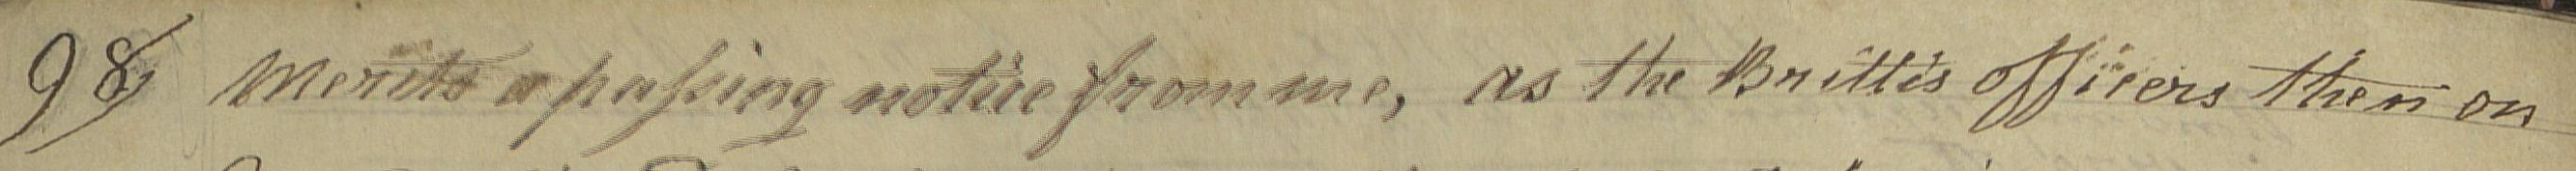98 merits a passing notice from me, as the the Brittis officers then on
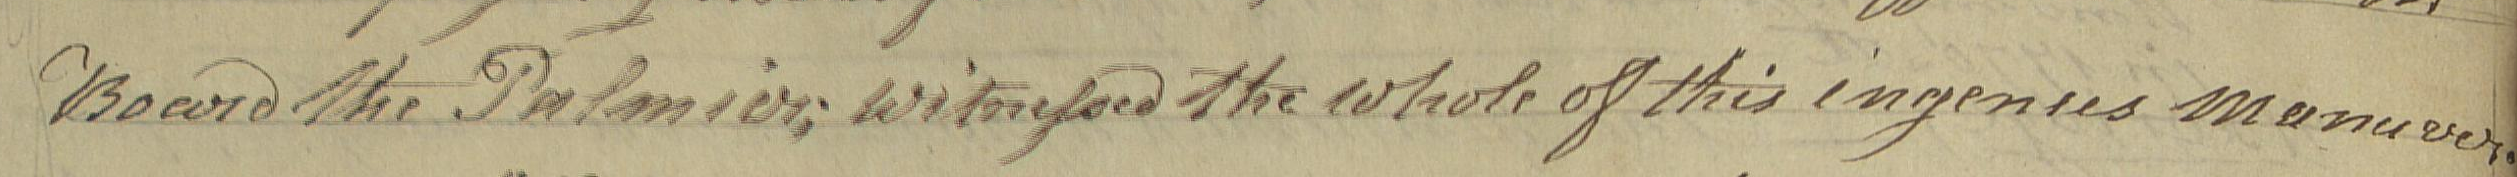Board the Palmier; witnessed the whole of this ingenus manuver
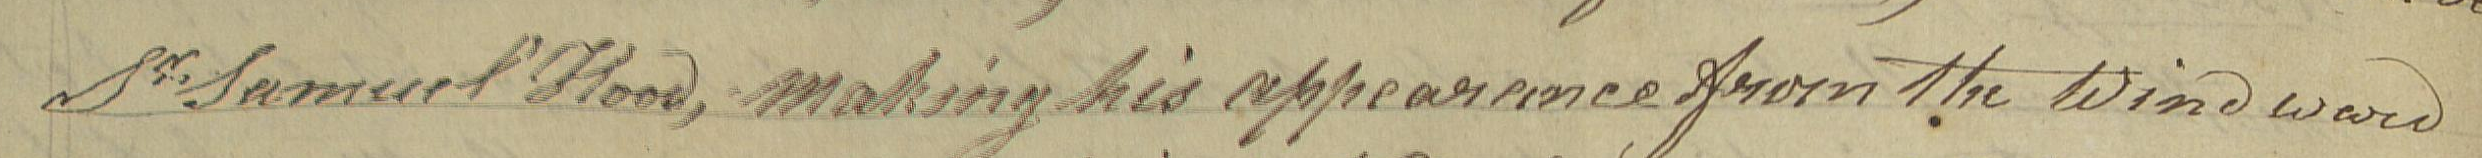S^r Samuel Hood, making his appearance from the Windward
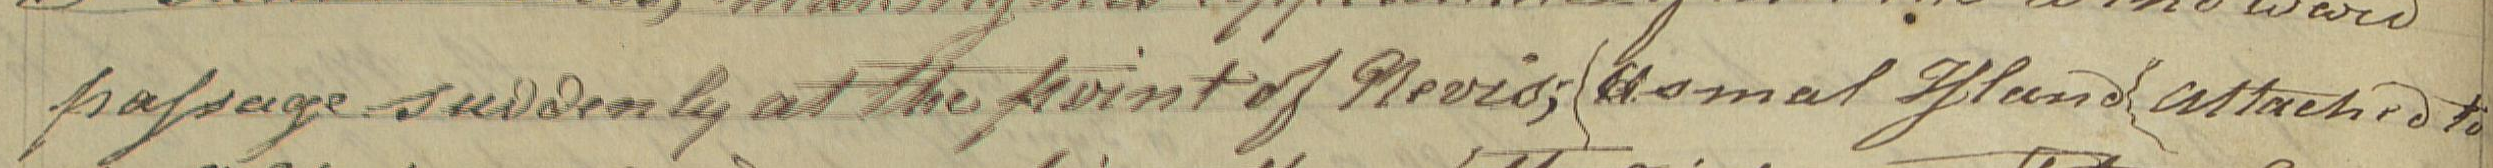passage suddenly at the point of Nevis; (smal Island (attached to
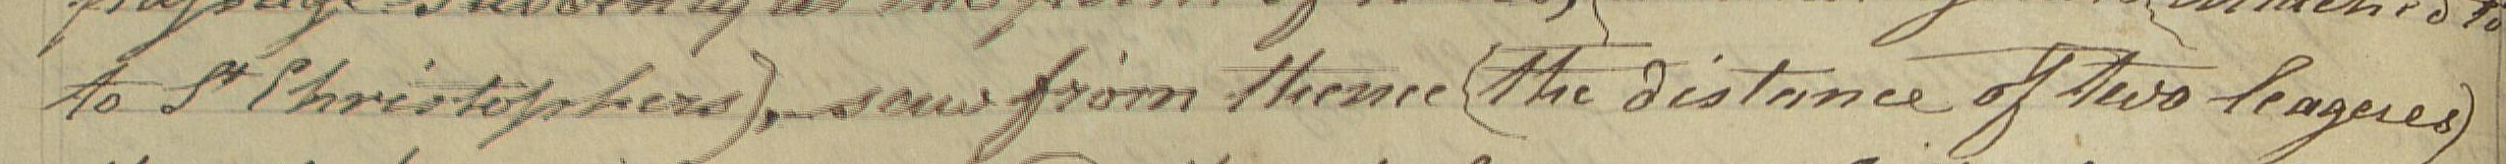to S^t Christophers), saw from thence (the distance fo two leagues)
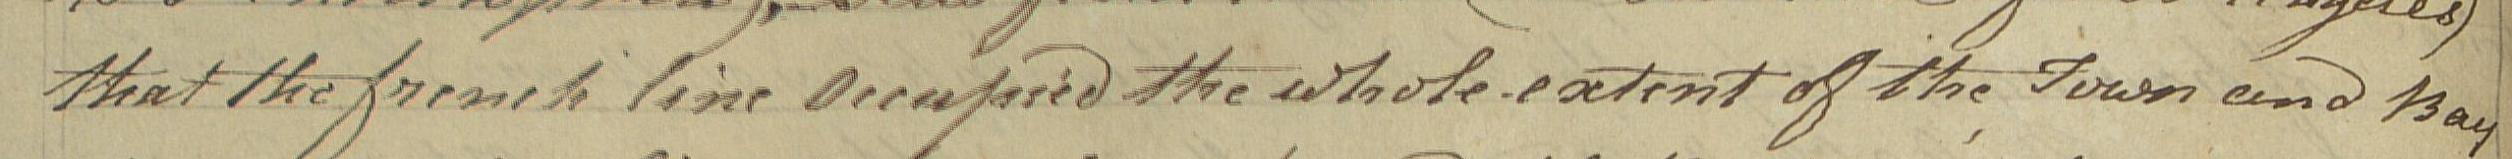that the french line occupied the whole extenet of the Town and Bay
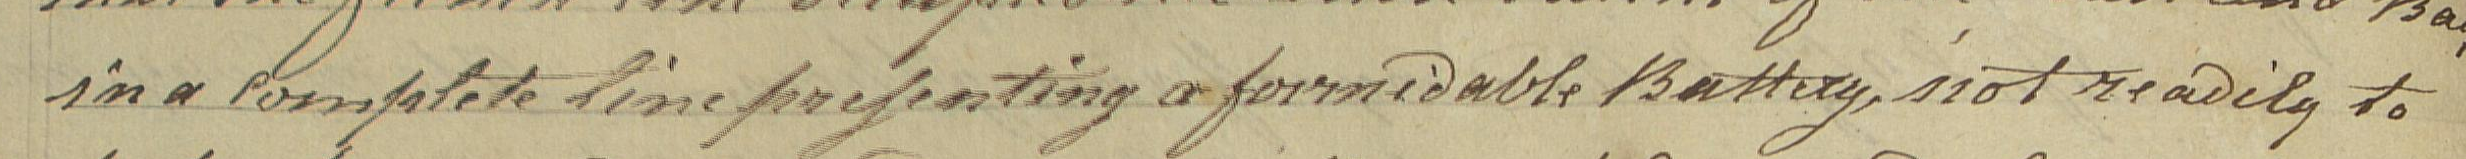in a complete line presenting a formidable Battery, not readily to
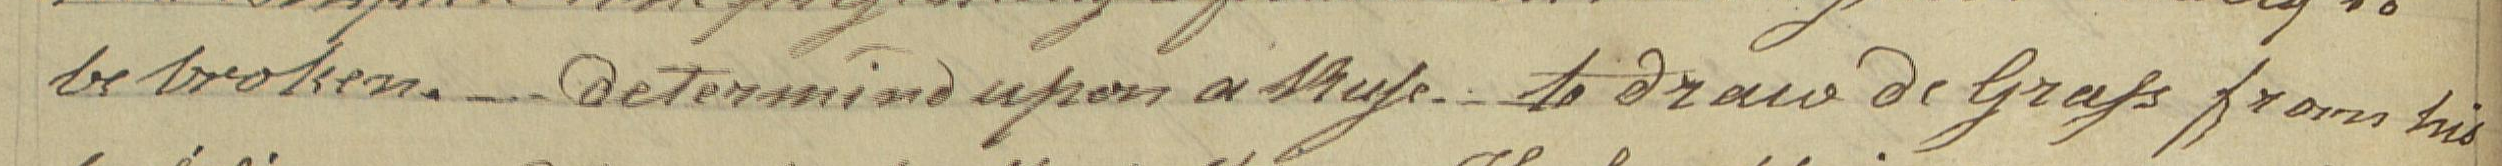be broken. determind upon a Ruse to draw de Grass from his
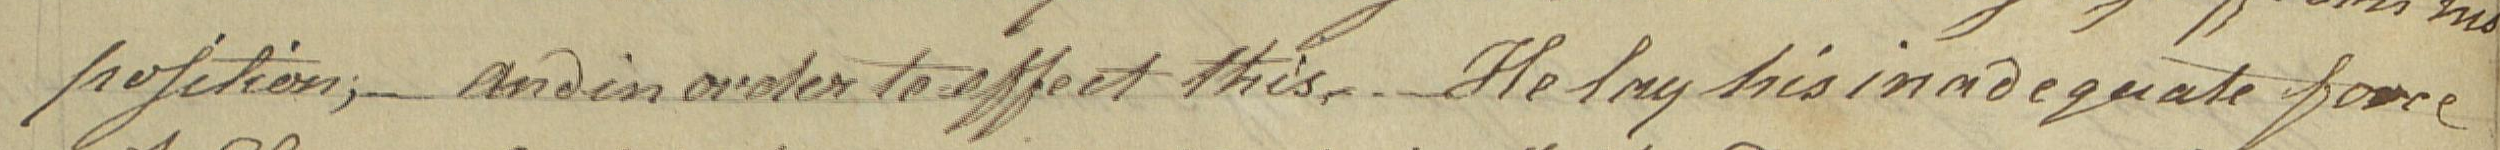position; and in order to effect this, He lay his inadequate force
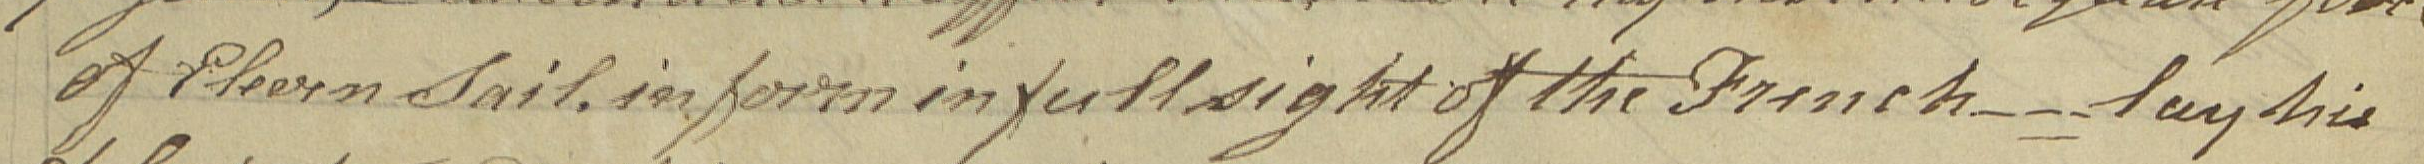of Eleven Sail, in form in full sight of the French lay his
